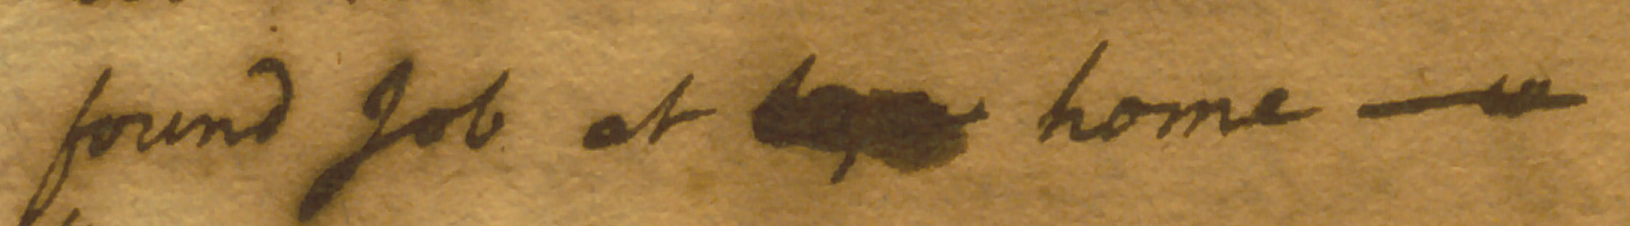found Job at [____] home-
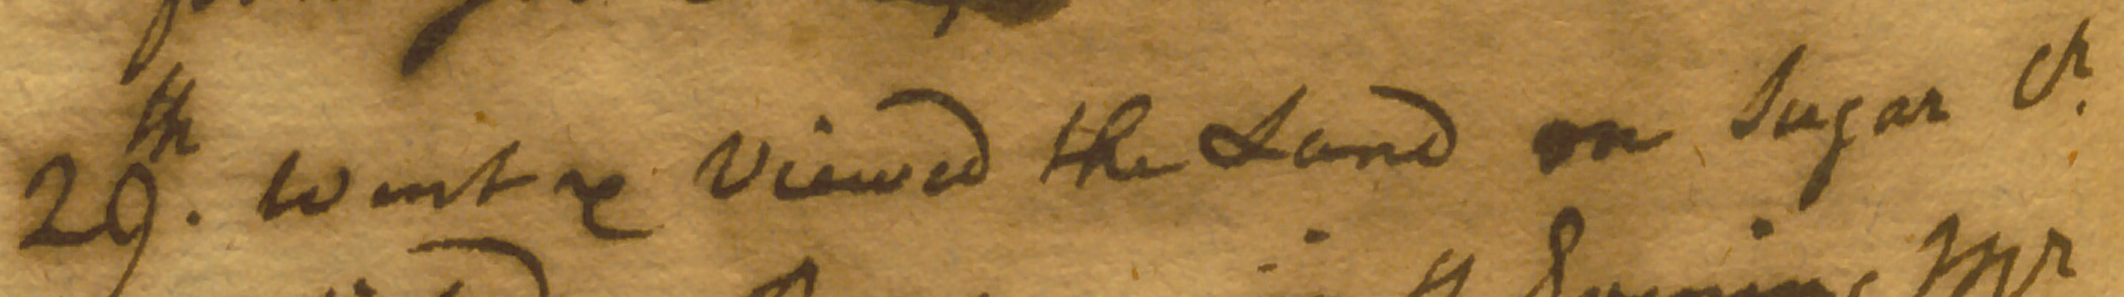29^th. went & viewed the land on Sugar C^r.
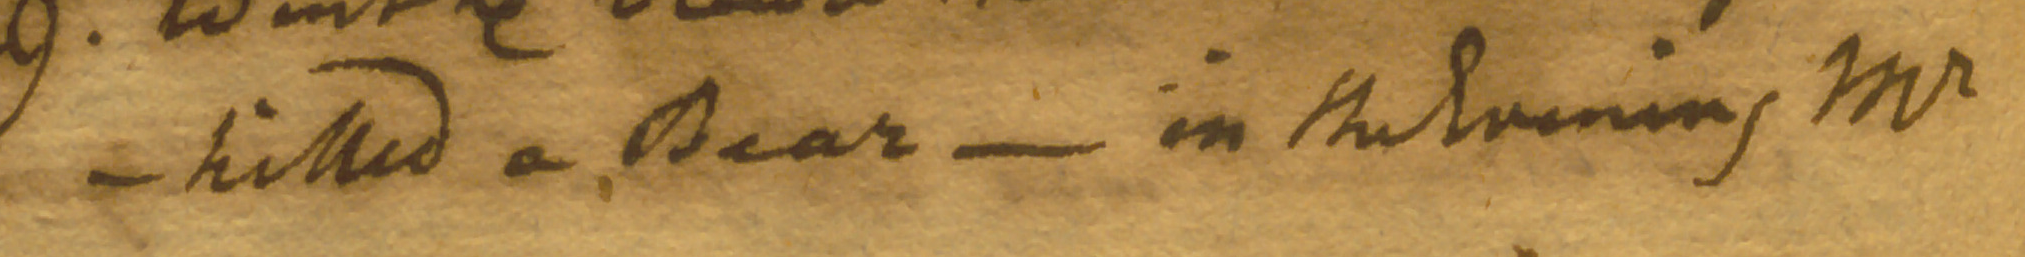-killed a Bear- in the Evening M^r
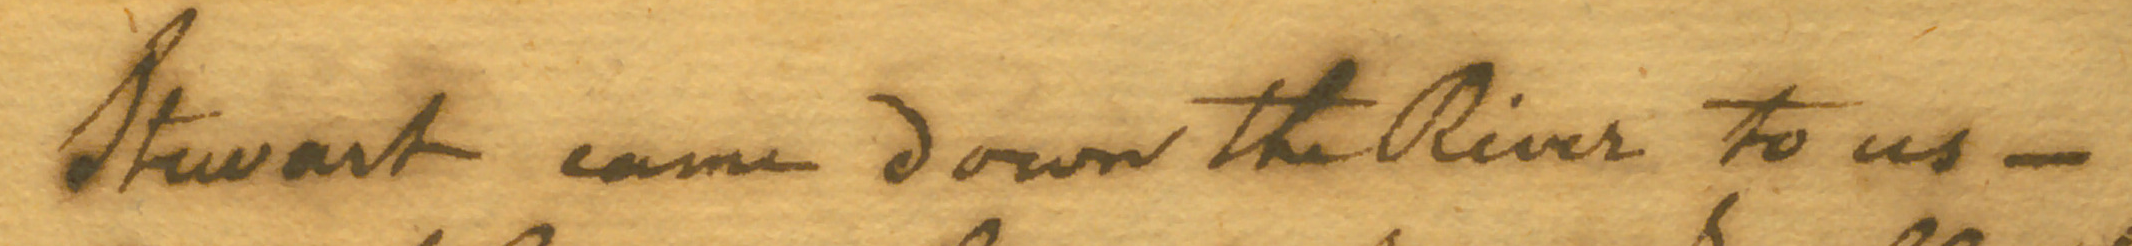Stewart came down the River to us-
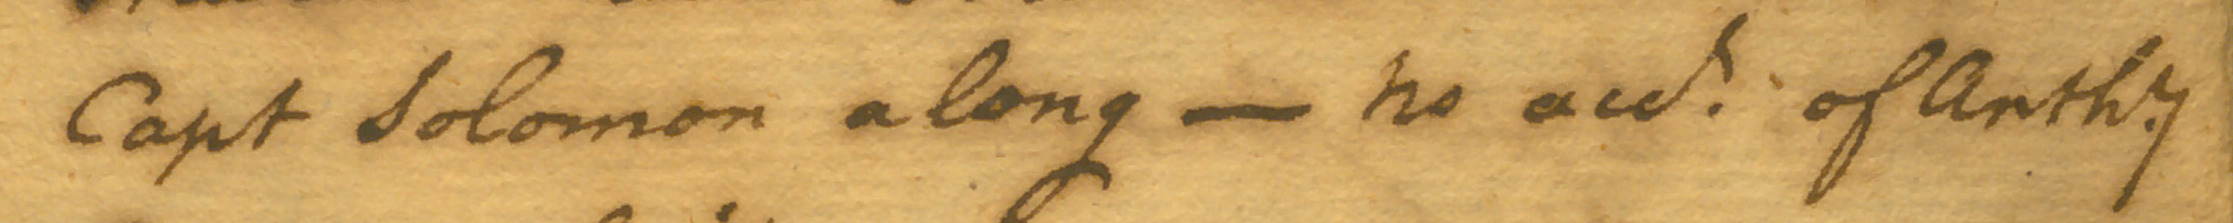Capt Solomon along- no acc^t. of Anth^y.
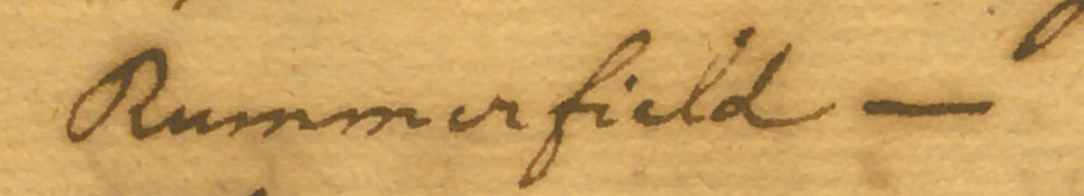Rummerfield-
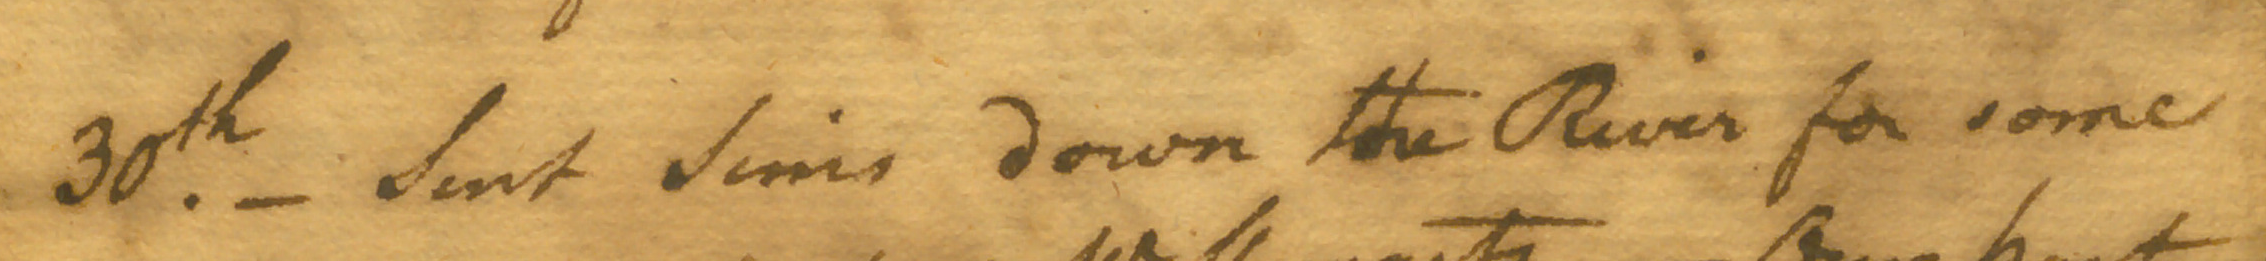30^th.- Sent Lewis down the River for some
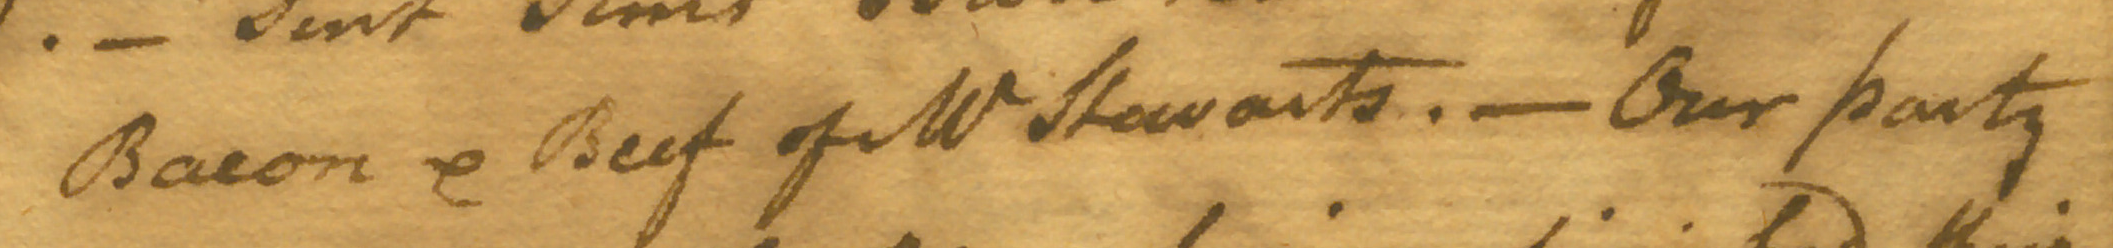Bacon & Beef of M^r Stewarts.- Our party
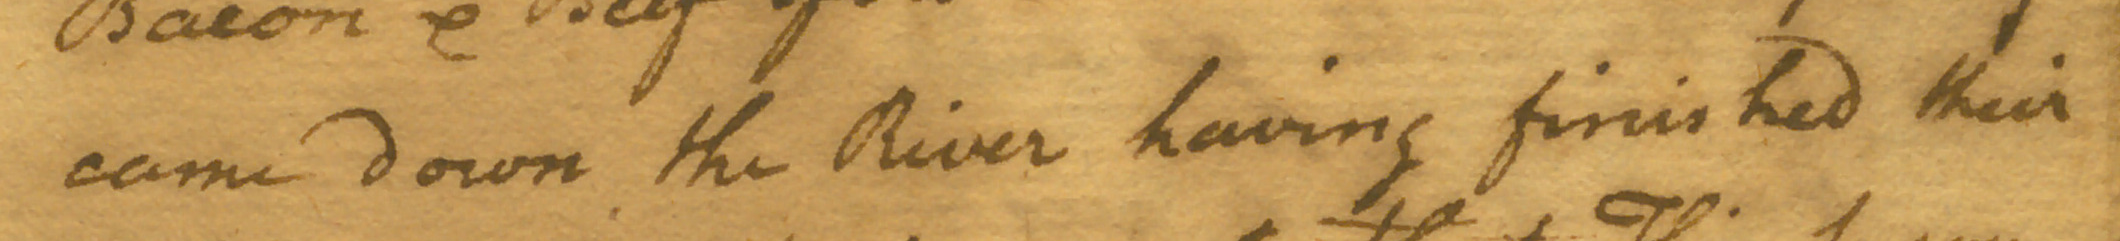came down the River having finished their
